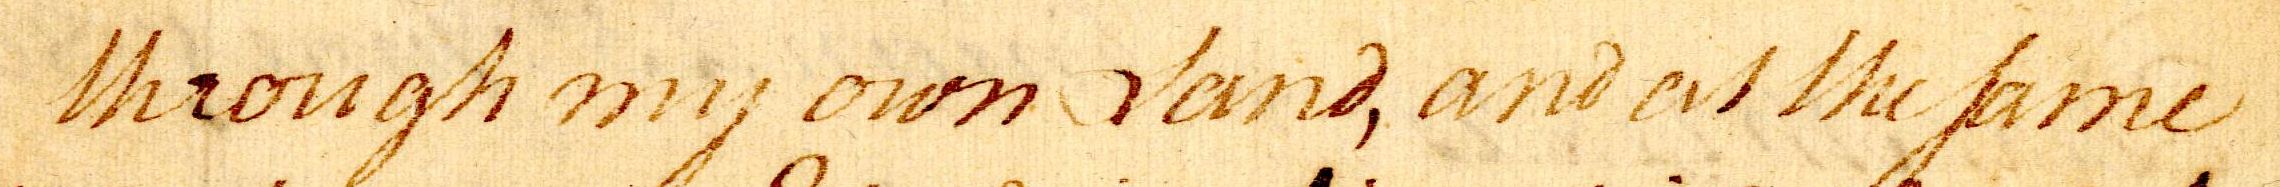through my own Land, and at the same
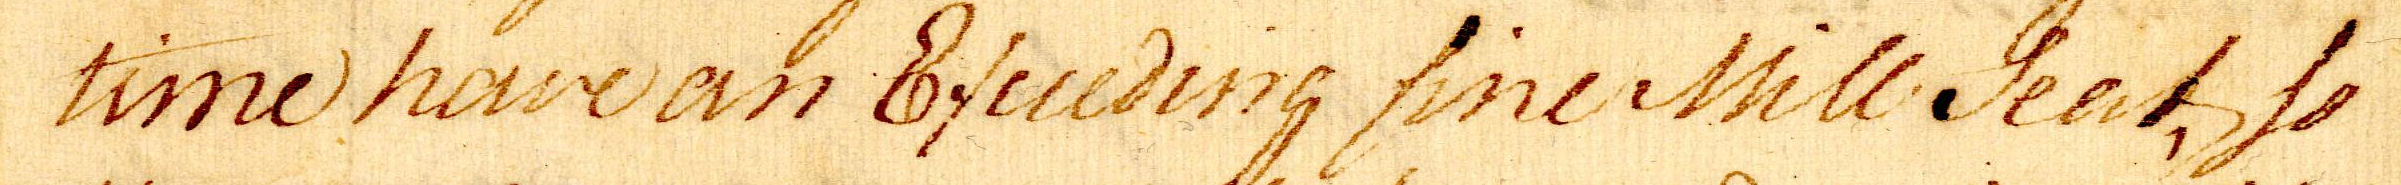time have an Exceeding fine Mill Seat, so
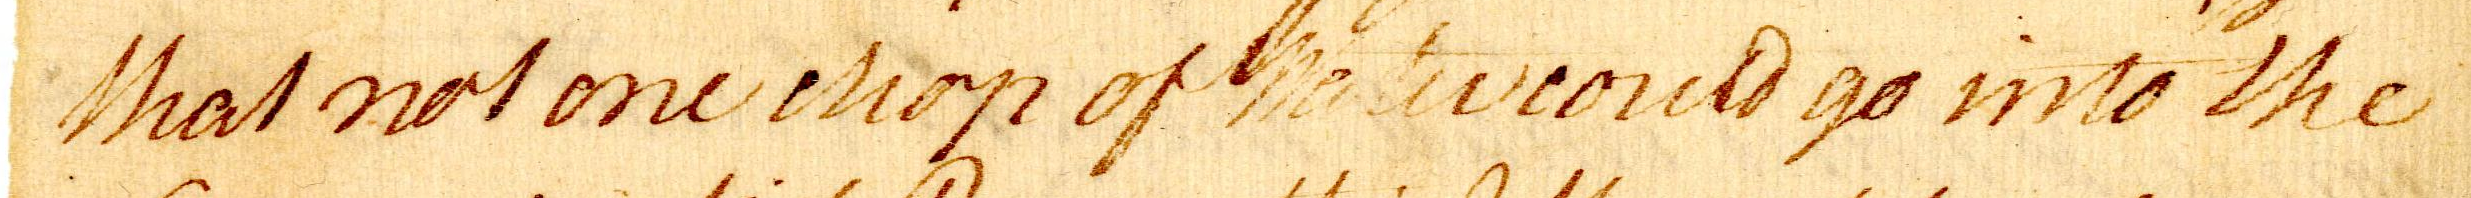that not one chop of the sword go into the
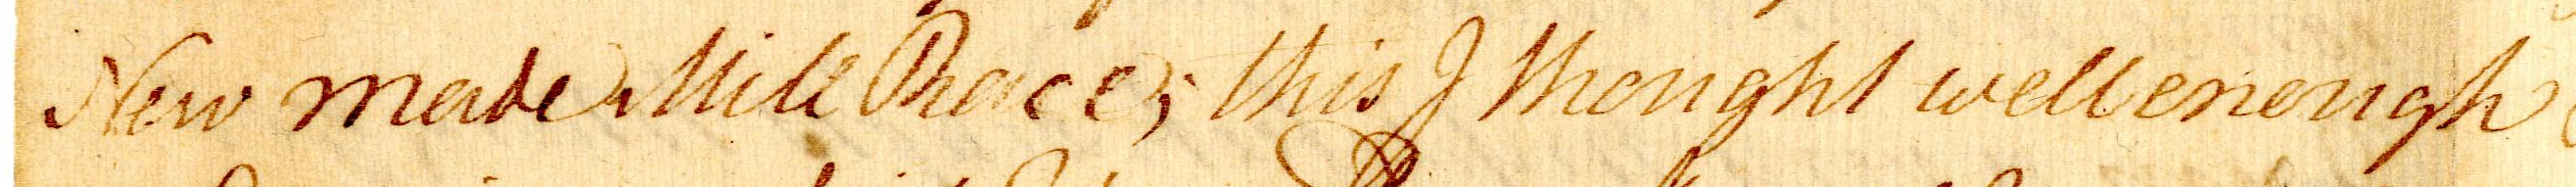New made Mill Race; this I thought well enough
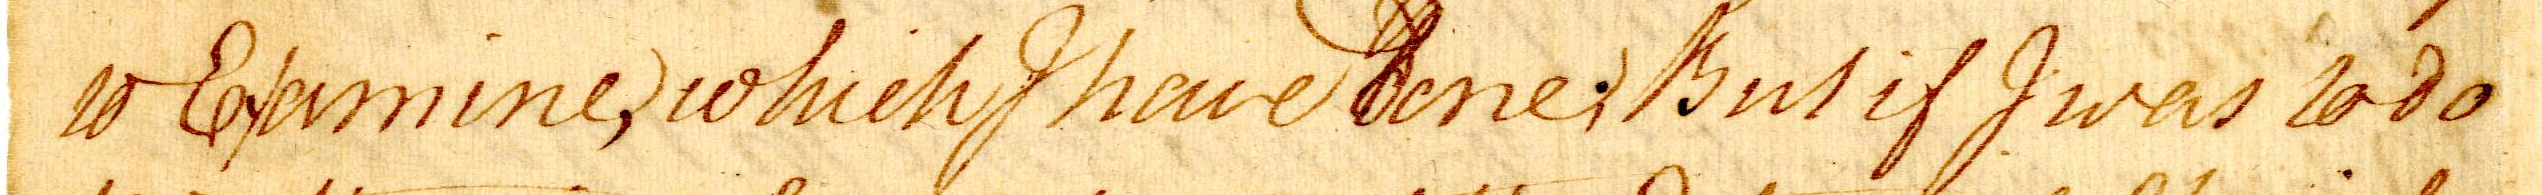to Examine which I have done; But if I was to do
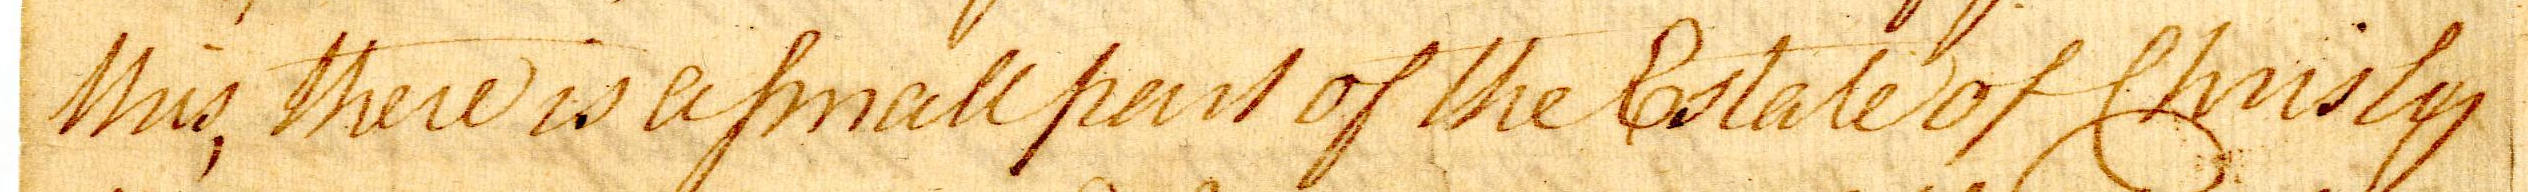this, there is a small part of the Estate of Christy
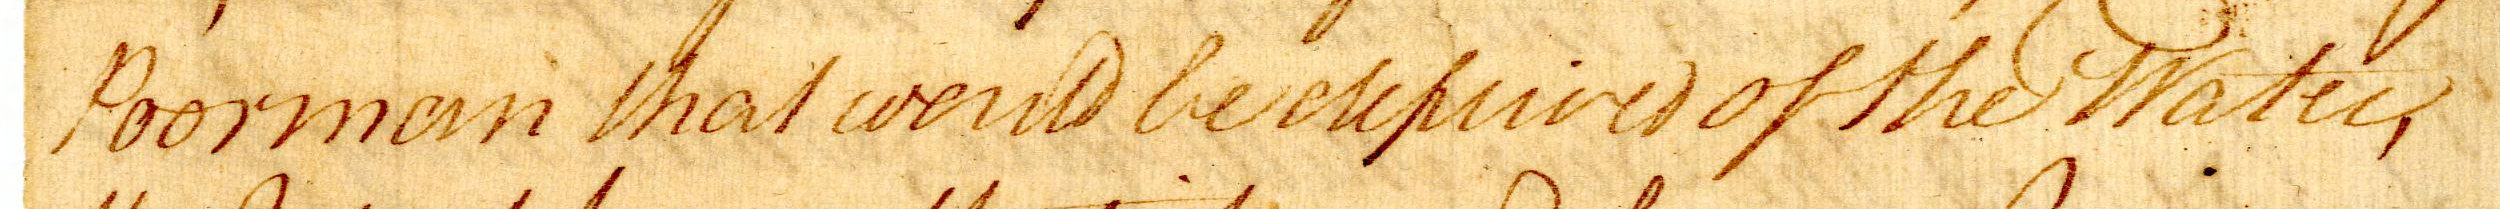Poorman that would be deprived of the Water,
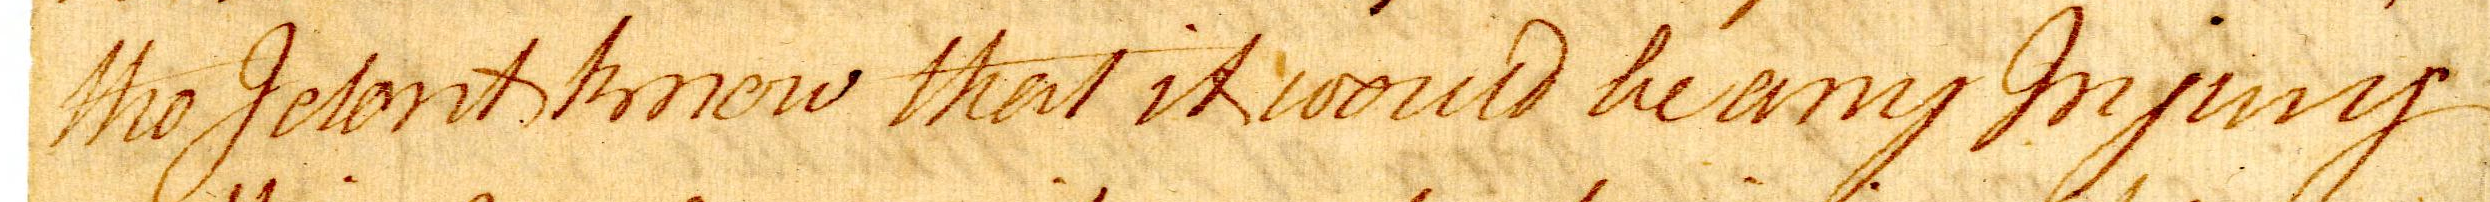tho I dont know that it would be any Injury
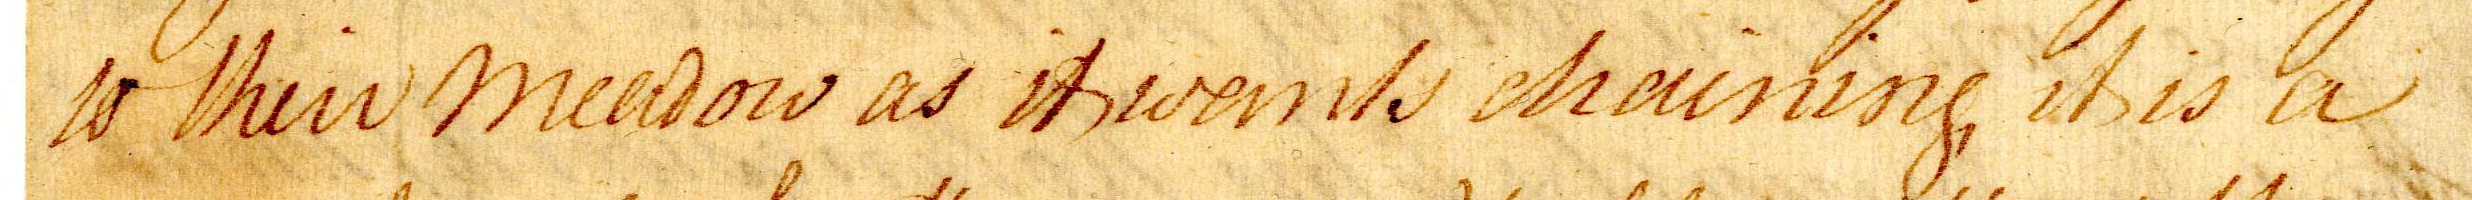to their meadow as it wants draining, it is a
